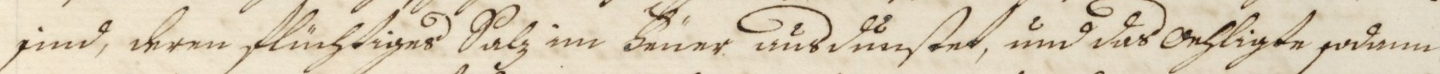sind, deren flüchtiges Salz im Feüer ausdunstet, und das Oehligte sodann
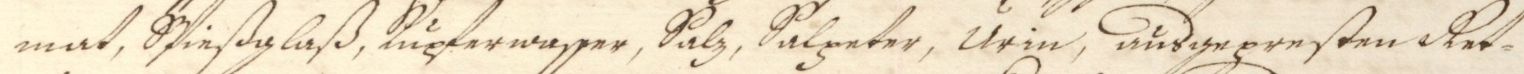mat, Spießglaß, Kupferwasser, Salz, Salpeter, Urin, ausgepresten Ret-
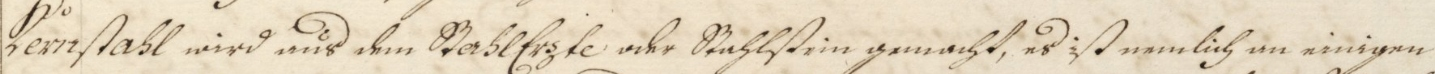Kernstahl wird aus dem StahlErzte oder Stahlstein gemacht, es ist nemlich an einigen
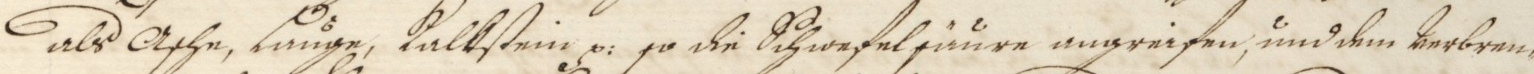als Asche, Lauge, Kalkstein etc. so die Schwefelsäure angreifen, und dem verbren-
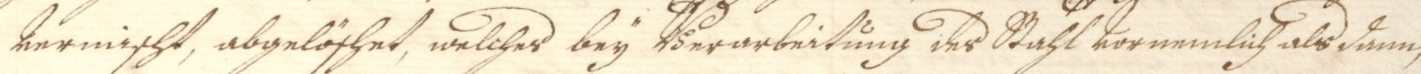vermischt, abgelöschet, welches bey Verarbeitung des Stahl vornemlich als dann,
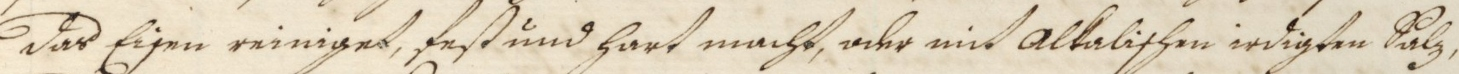das Eisen reiniget, fest und hart macht, oder mit Alkalischen irdigten Salz,
